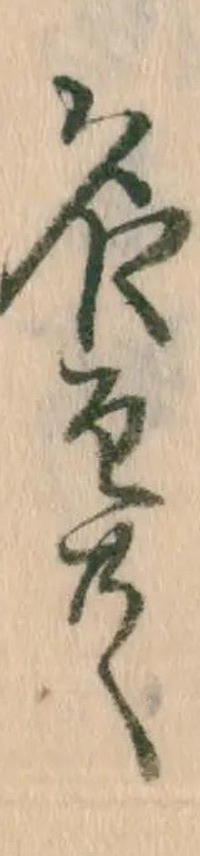名主共

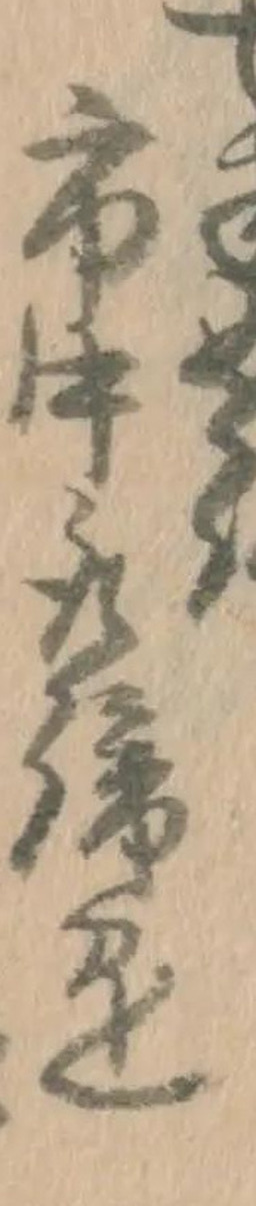市中取締懸

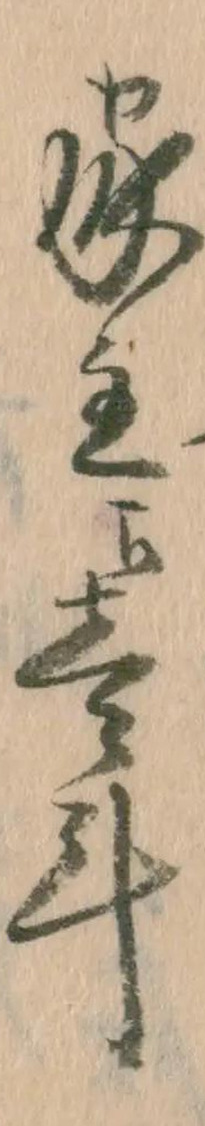家主え壱斗
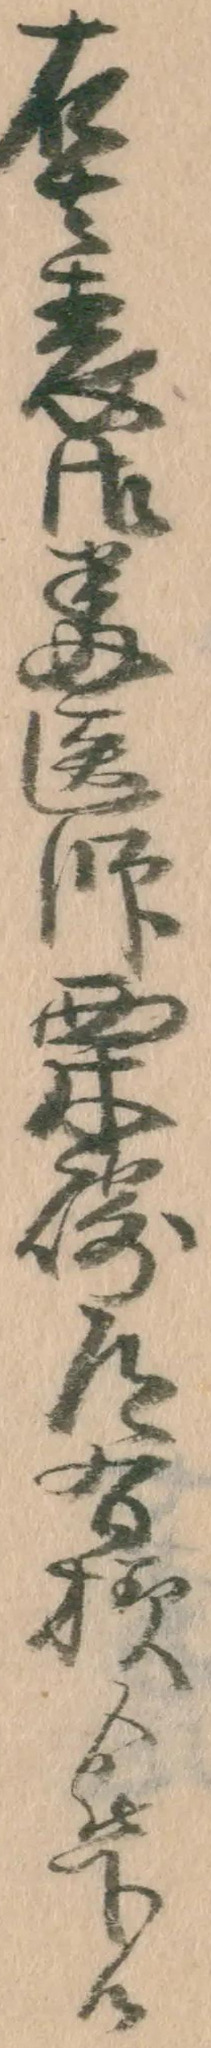右は表御番医師栗崎道有様ゟ被下候
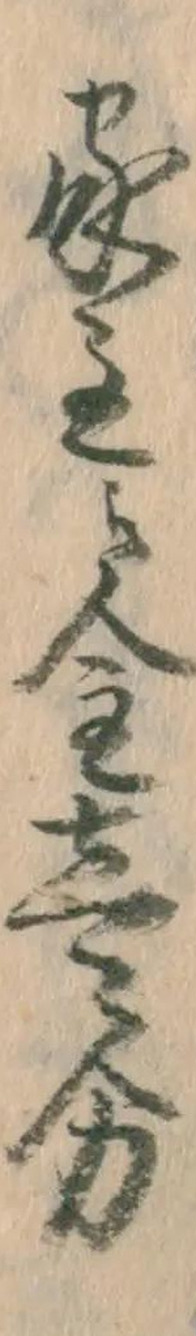家主え金壱分

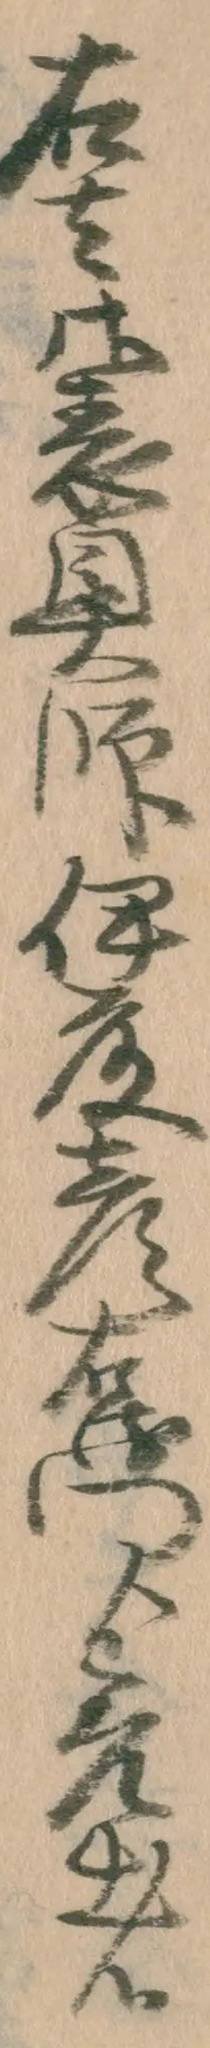右は御表具師伊藤彦右衛門ゟ差出候
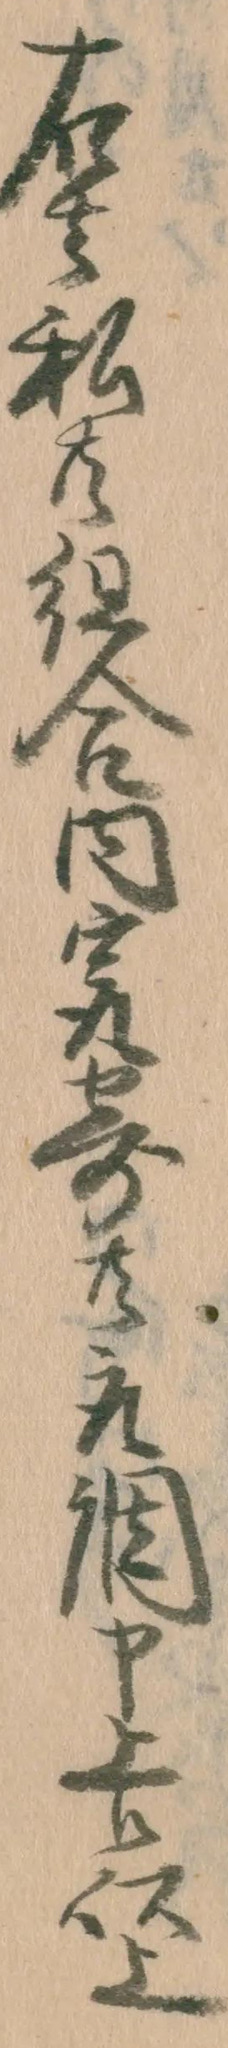右は私共組合内最寄共取調申上候以上
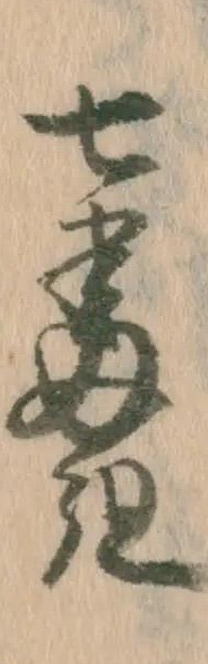七番組
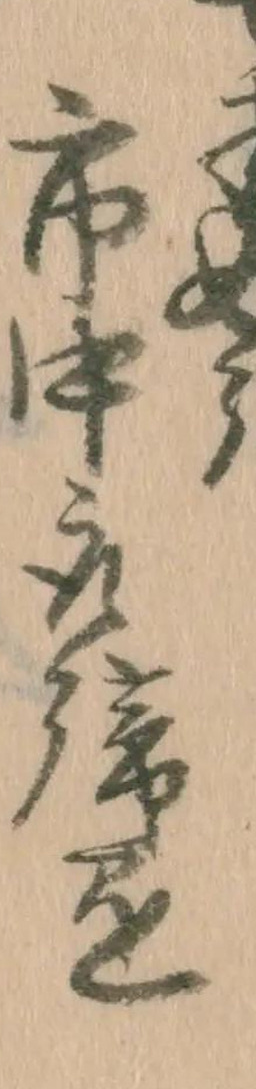市中取締懸
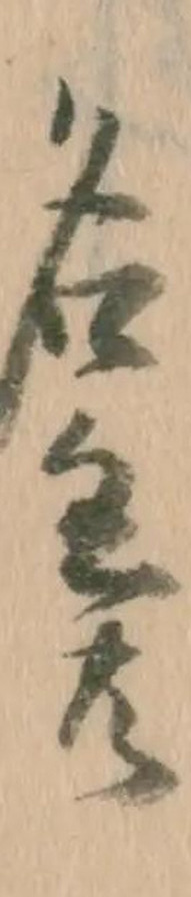名主共
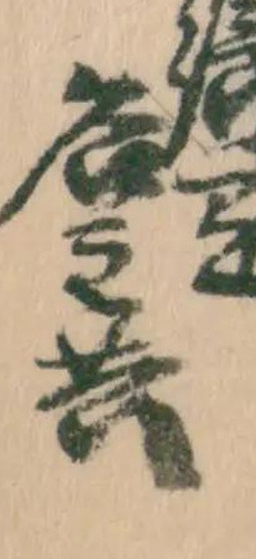名主共

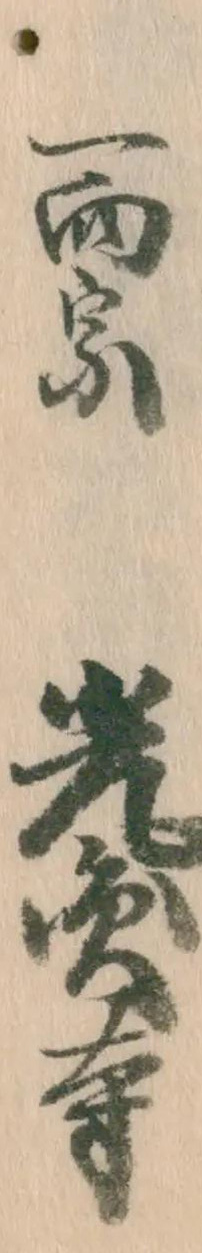一向宗光円寺
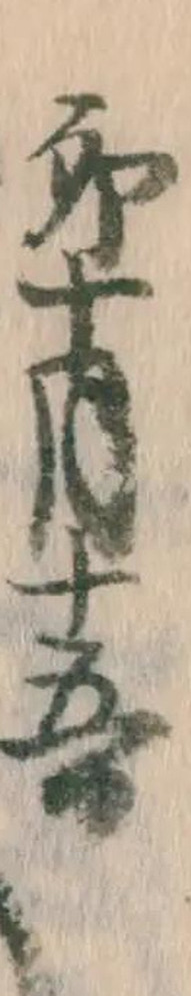卯十月廿六日
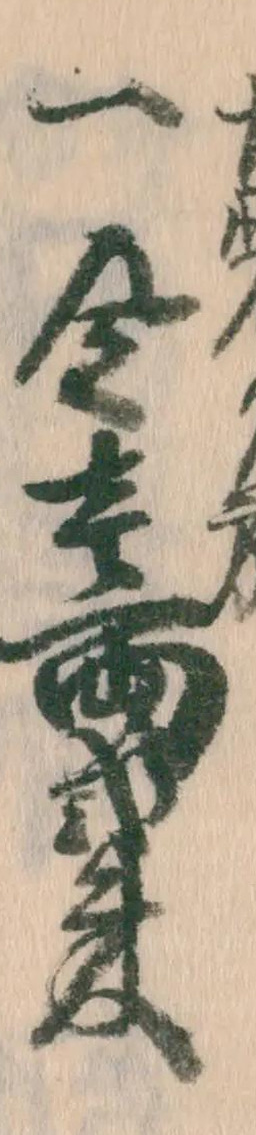一金壱歩弐朱右町
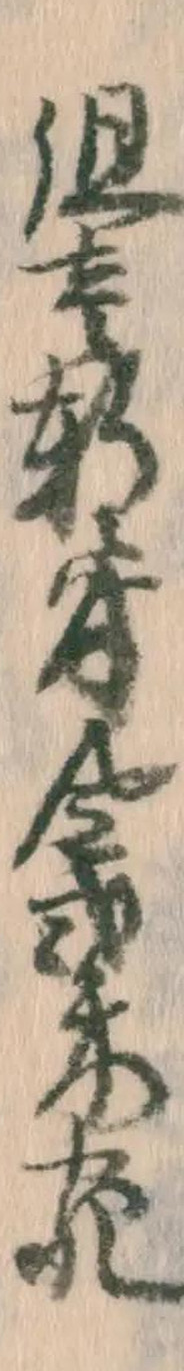但壱人ニ付金弐朱宛
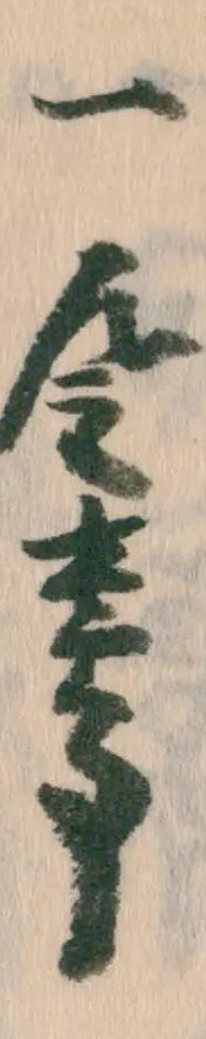一金壱分
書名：武家方并寺院等ニテ施差出候一件
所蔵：国立国会図書館 National Diet Library, JAPAN
